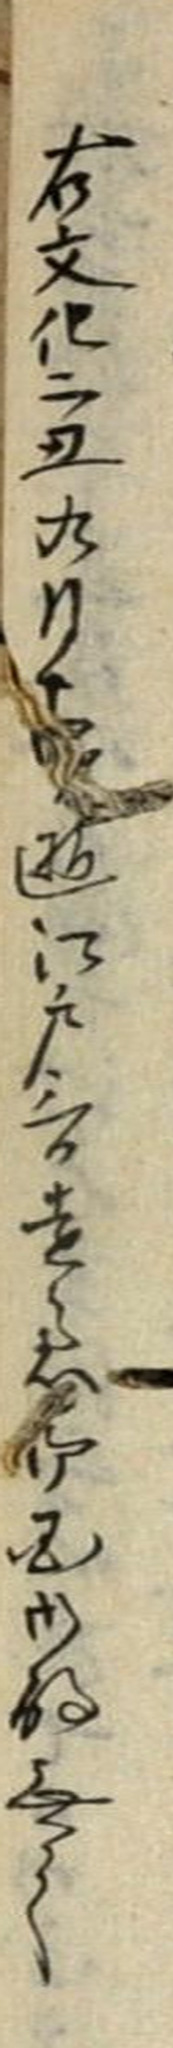右文化二丑九月十四日逝江戸三日遠慮御国御触無之
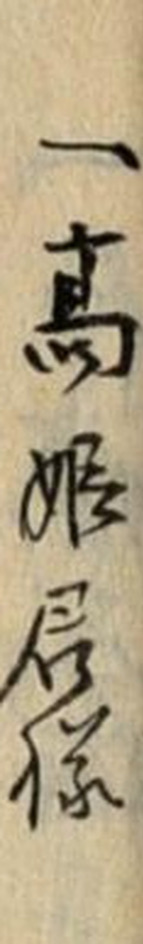一高姫君様
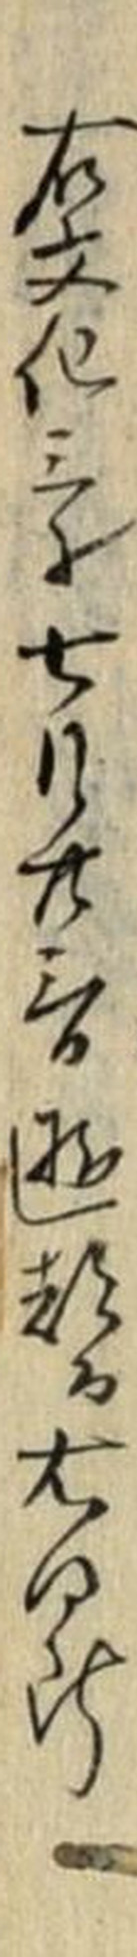右文化三刁七月廿三日逝都而右同断
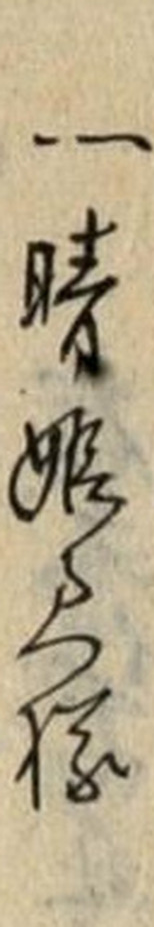一晴姫君様
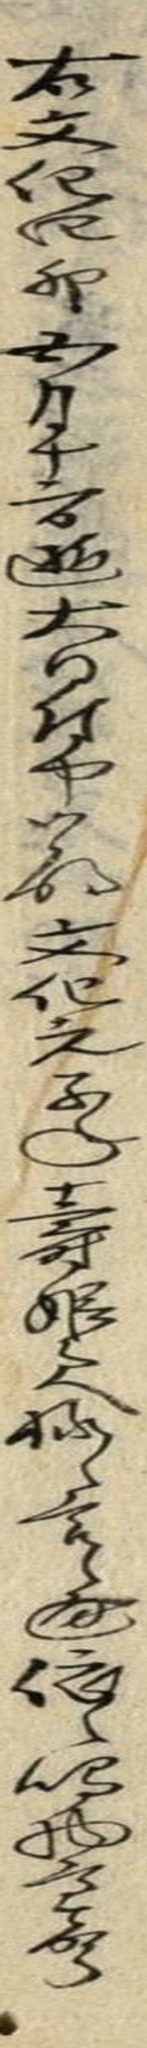右文化四卯五月十二日逝大目付中御触文化元子年寿姫君様之節之通依之鳴物高声
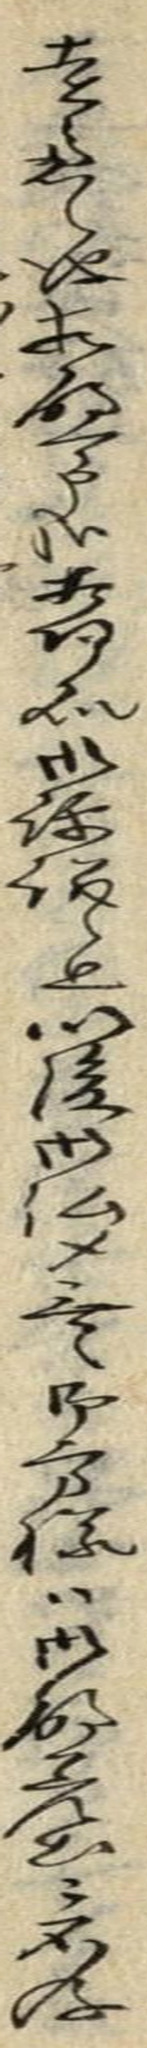遠慮之儀相触可申哉相伺候処御評議之上以後御弘メ無之御方様は御触差出に不及
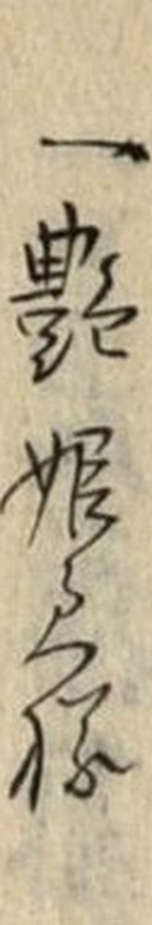一艶姫君様
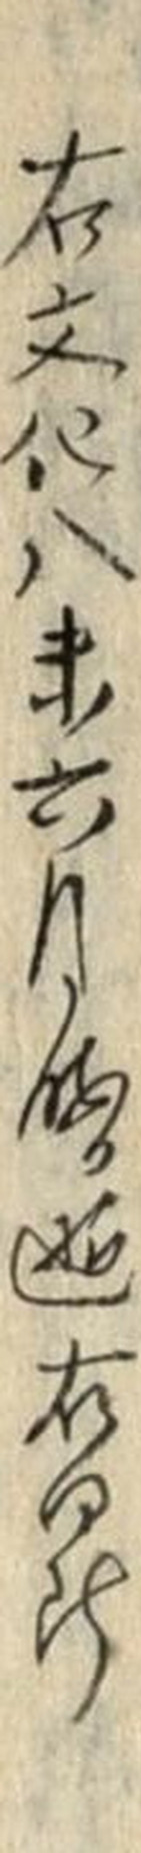右文化八未六月晦日逝右同断
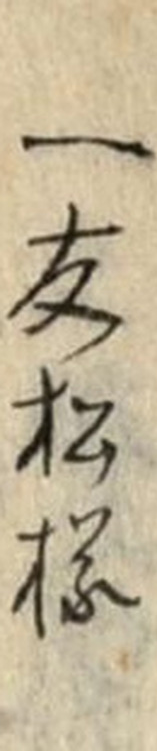一友松様
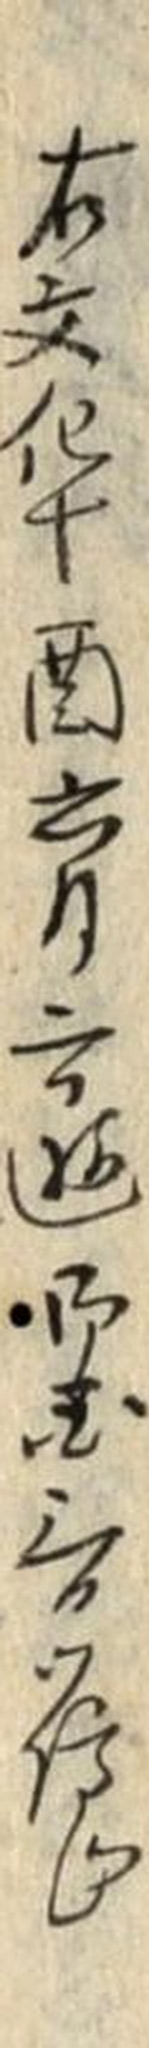右文化十酉六月二日逝御国三日御停止
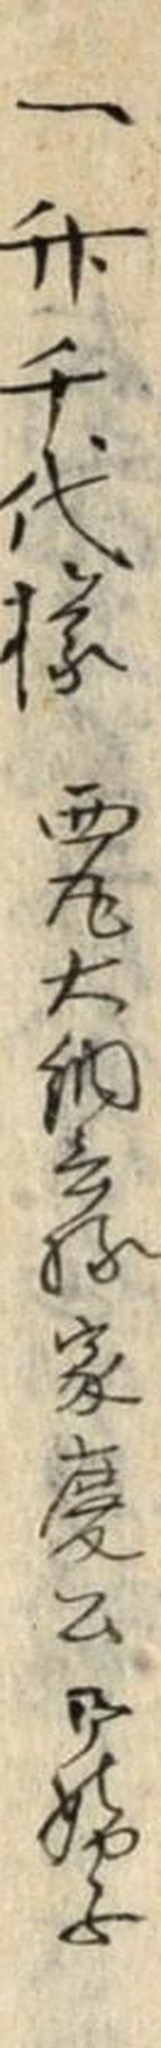一竹千代様西丸大納言様家慶公御嫡子
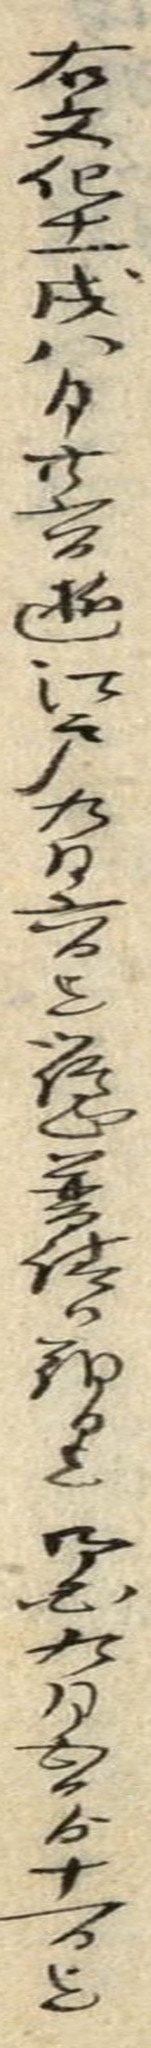右文化十一戌八月廿六日逝江戸九月六日迄御停止普請は朔日迄御国九月五日ゟ十一日迄
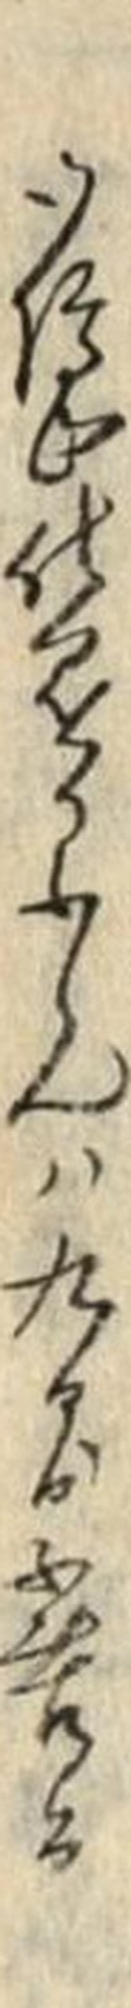御停止仕懸りふしんは九日ゟ不苦旨
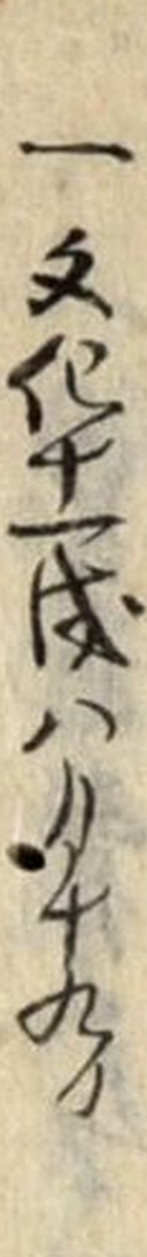一文化十一戌八月十九日
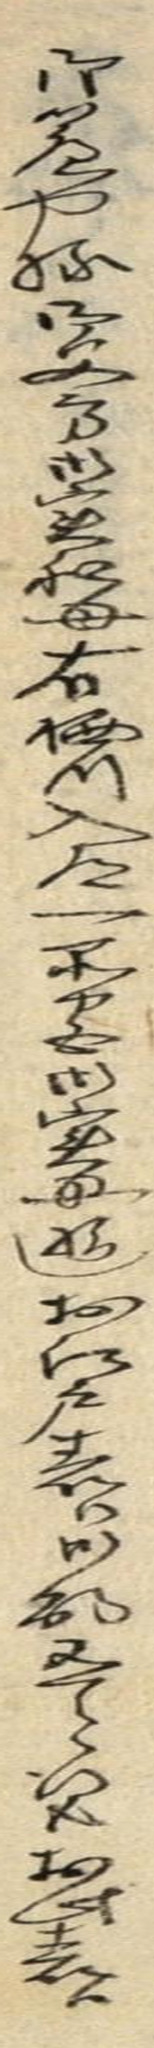御簾中様御父方御実祖母有栖川入道一品宮御実母逝於江戸表は御触有之候得共於此表は

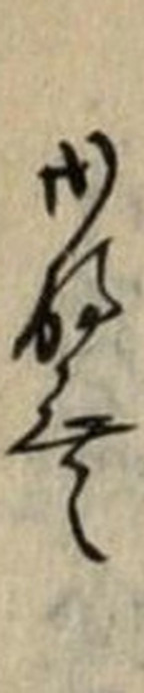御触無之
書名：御停止異変死失
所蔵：福井県文書館 Fukui Prefectural Archives
